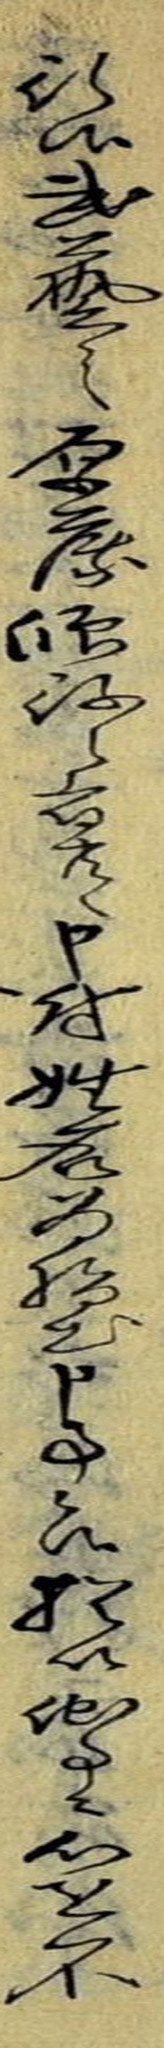行候武芸之厚薄師役之者共へ申付姓名為指出申事ニ候猶以他事ニ心を不
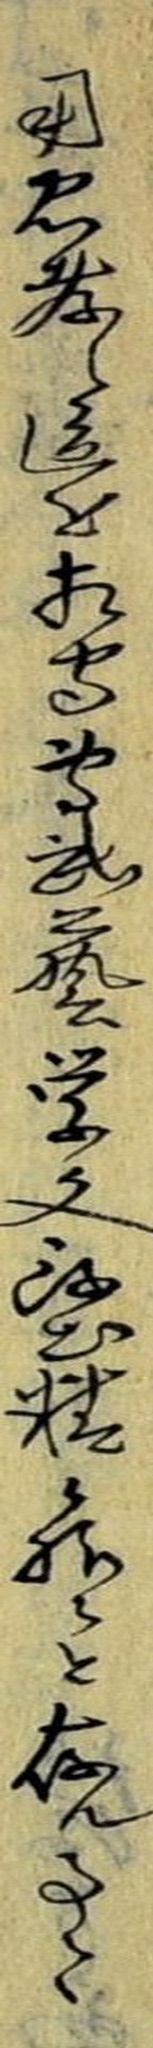用忠孝之道を相守専武芸学文致出精候様ニと存ル事ニ候
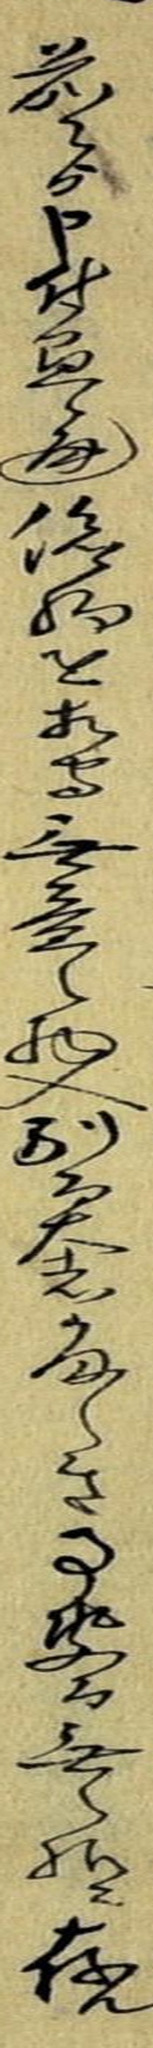一前々ゟ申付置候通倹約を相守無益之物入別而奢かましき事決而無之様ニ存ル
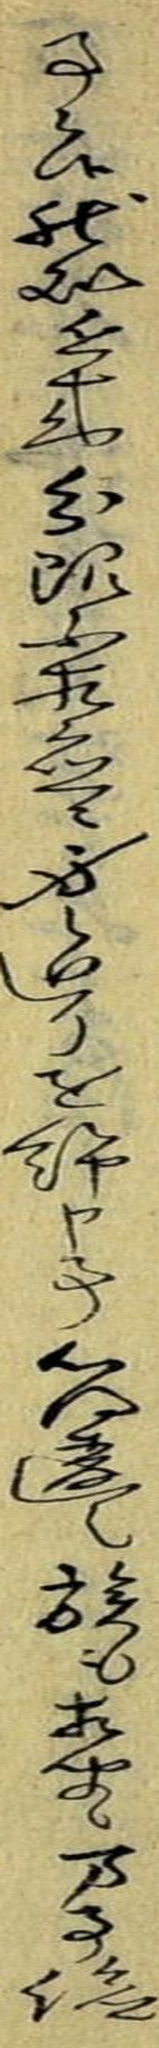事ニ候然処近来分限不相応ニ身之廻りを飾申事心得違之族も相聞候万事倹
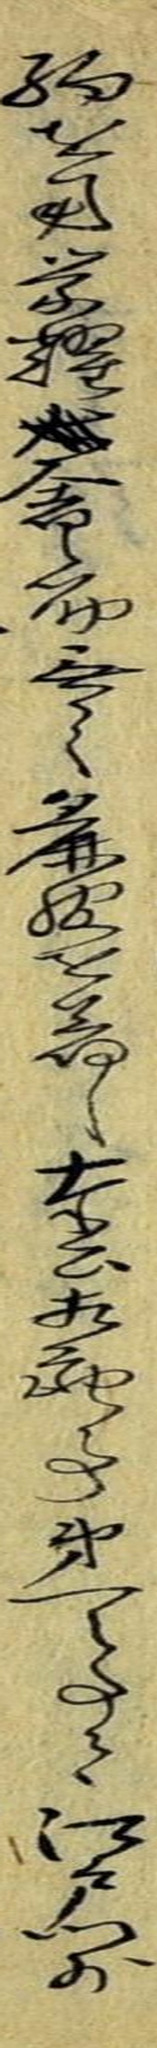約を用栄耀奢之筋無之麁服を着し奉公相勤候事第一之事ニ候江戸門外
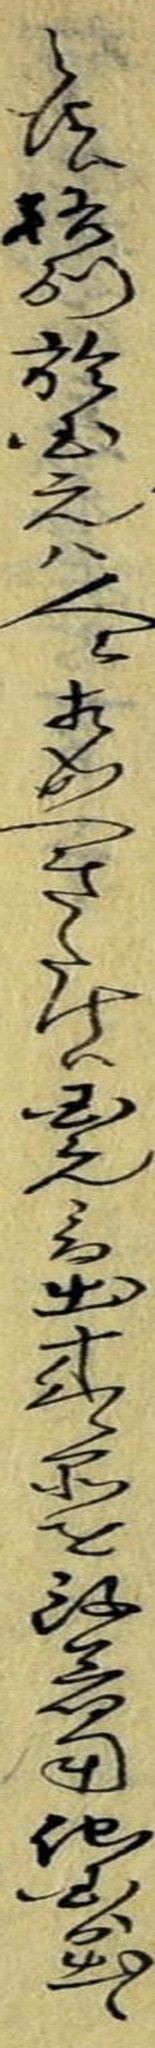之儀ハ格別於国元ハ人々相成へきたけハ国元ニ而出来候品を致着用他国ゟ出候
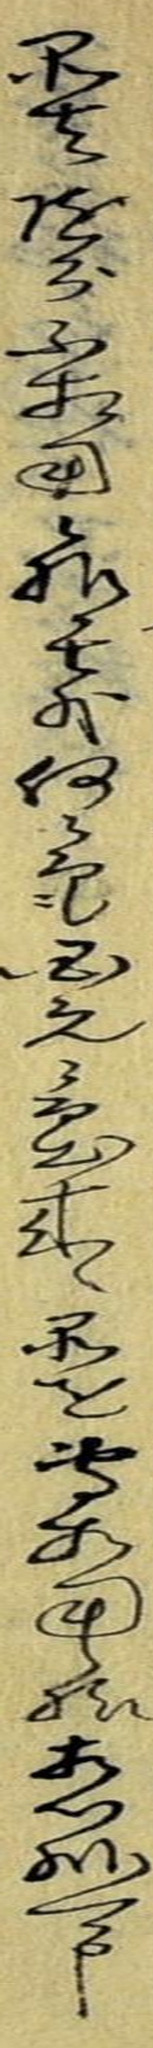品者随分不相用候様其外何ニ而も国元ニ而出来候品を専相用候様相心掛可申
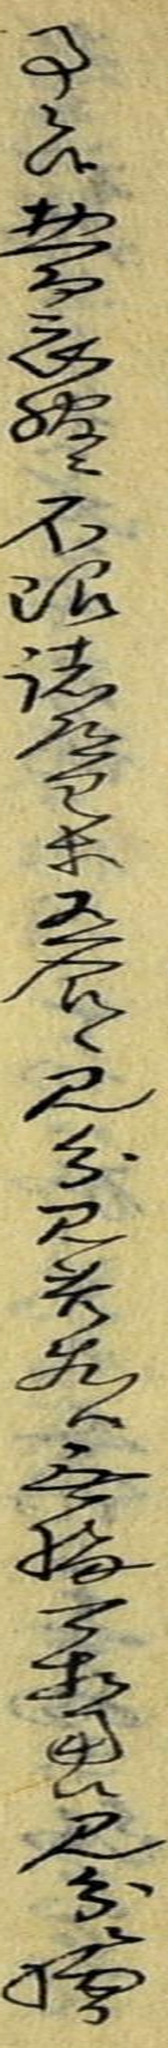事ニ候惣而衣服ニ不限諸道具等有合候見分見苦敷ハ無構可相用候見分ニ拘り
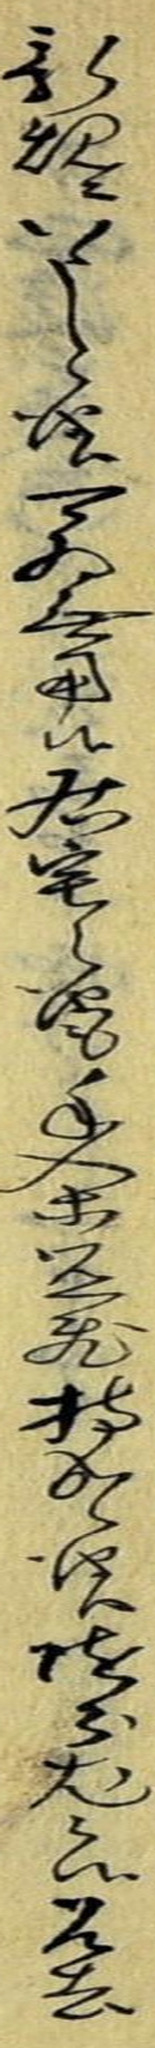新規ニいたし候儀ハ可為無用候居宅之儀も手入等宜敷持成候儀ハ随分尤ニ候乍去
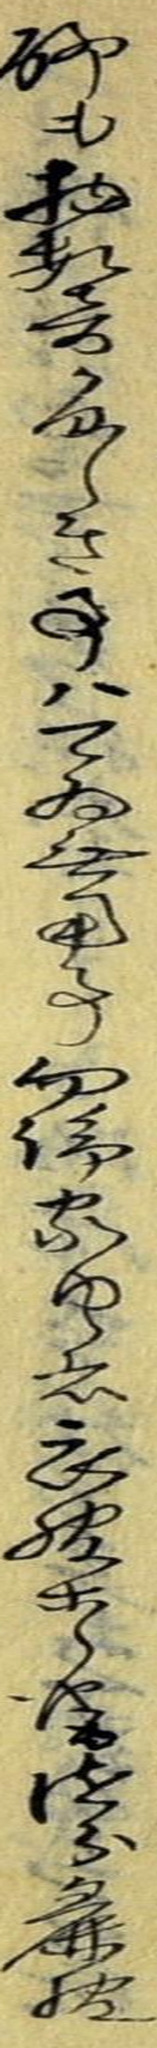聊も物数奇かましき事ハ可為無用事勿論家内之者衣服等之儀も随分麁服
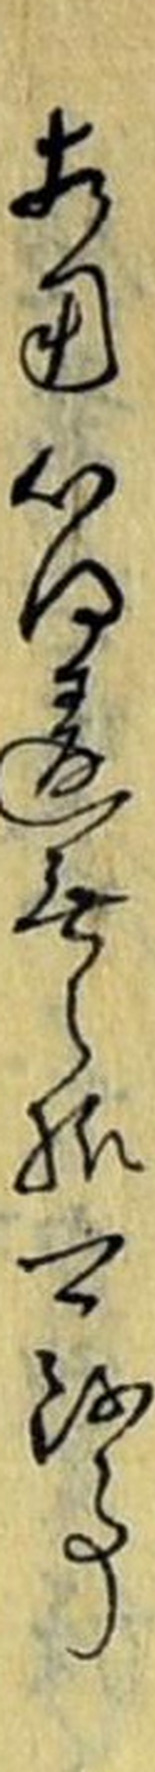相用心得違無之様可致事
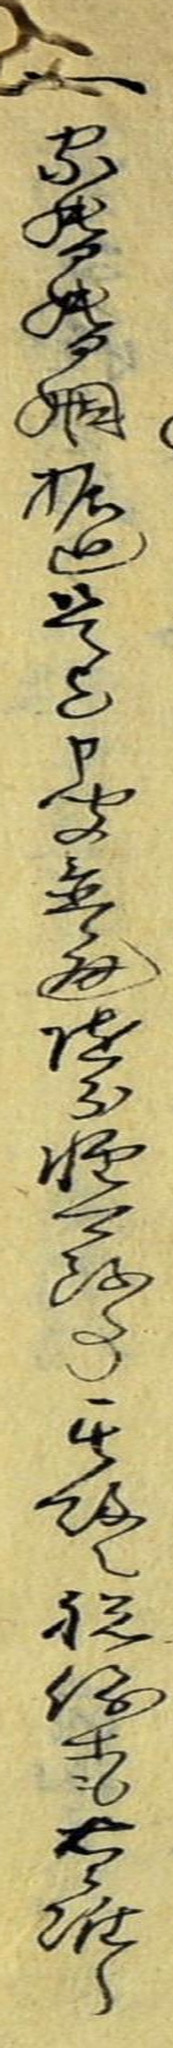一家督婚姻振廻是迄申聞置候通随分軽可致事其余之祝儀等も右ニ准し

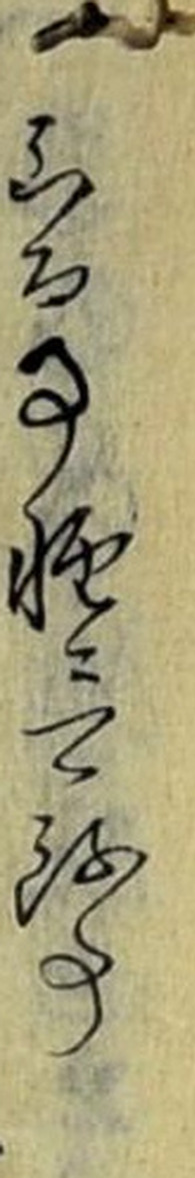至而事軽ニ可致事
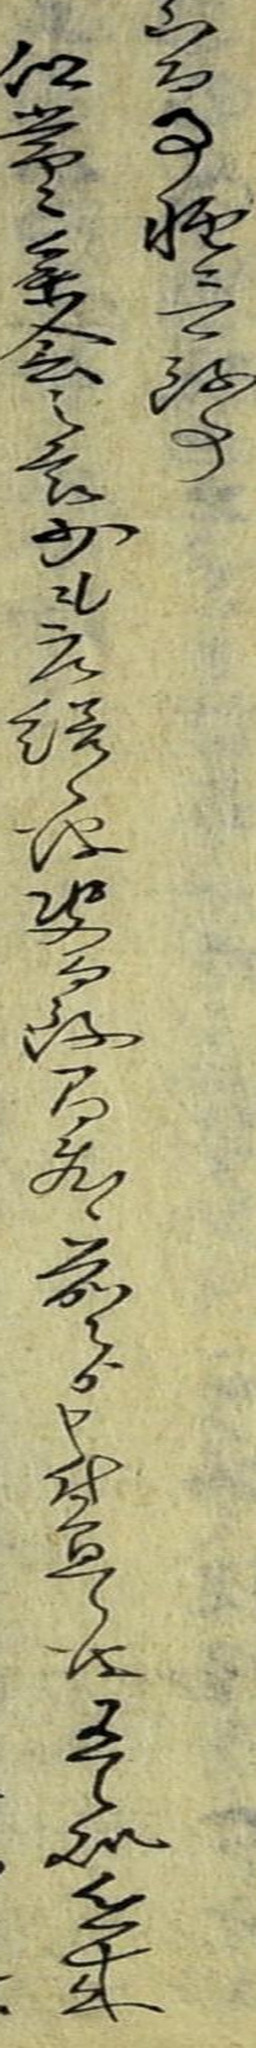但常々集会之節少も取続候儀決而致間敷候前々ゟ申付置候儀有之処近来
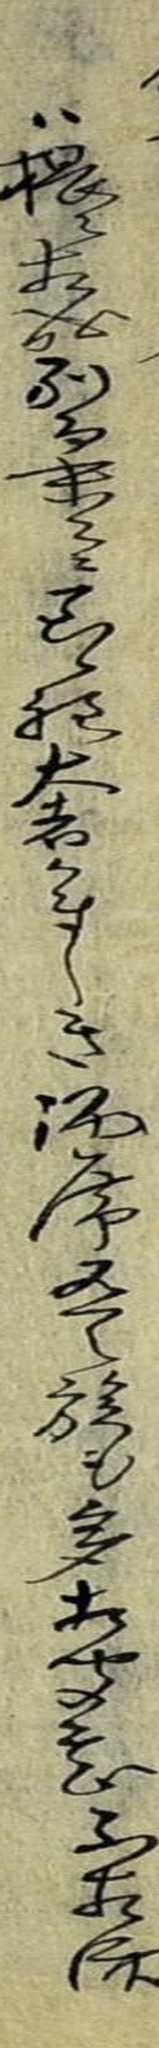ハ猥ニ相成別而末々ニ至候程奢かましき酒席有之族も多相聞甚不相済
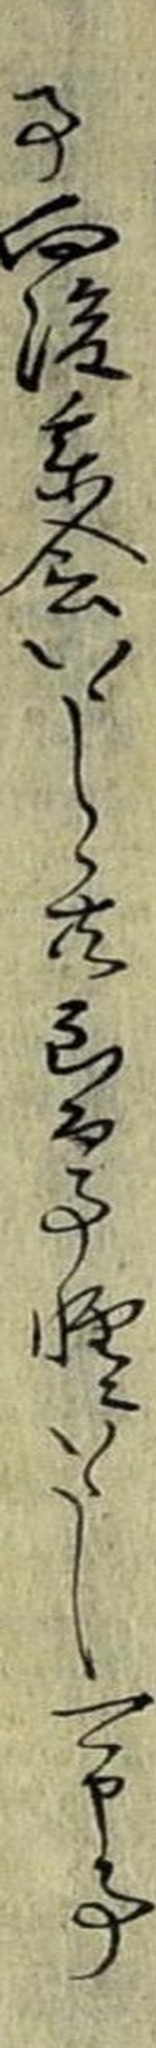事向後集会いたし候共至而事軽ニいたし可申事
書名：命令之部 三
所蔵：福井県文書館 Fukui Prefectural Archives
